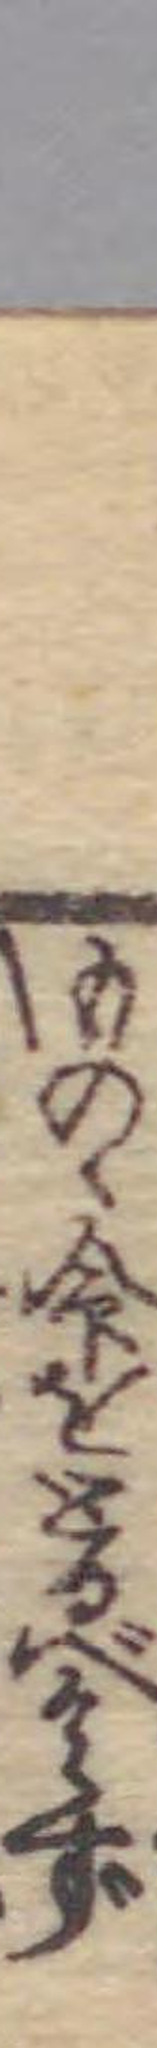ものゝ命をとるべからず
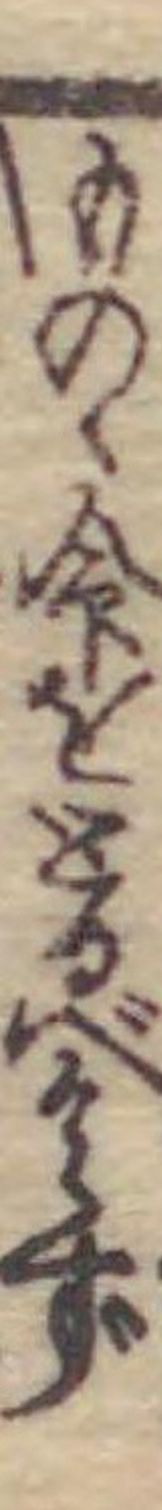ものゝ命をとるべからず
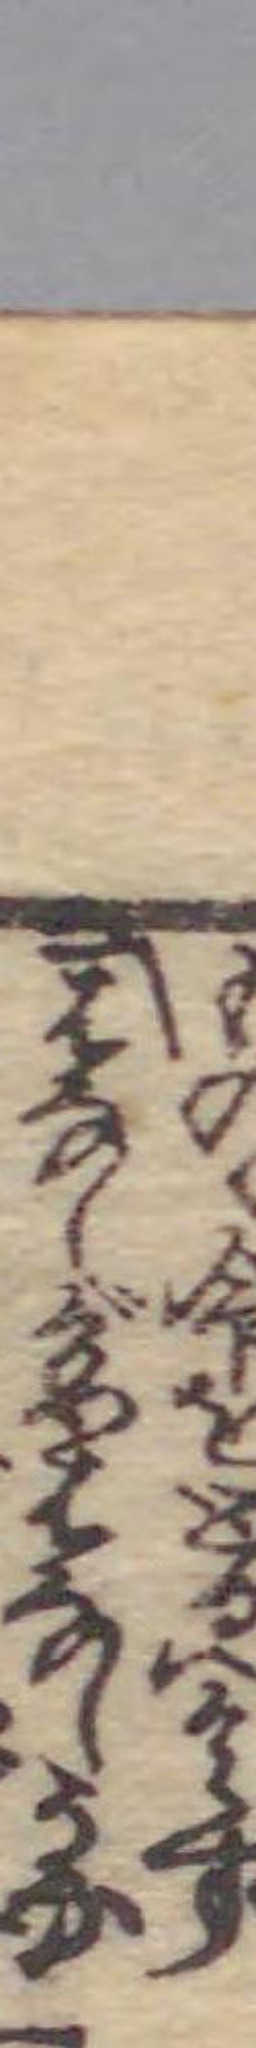〽はなしがめはなしうな
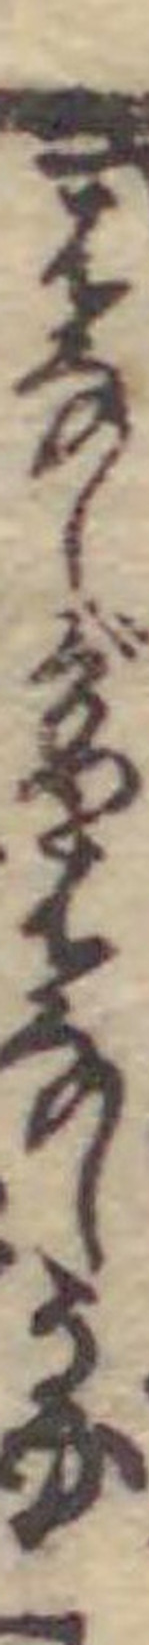〽はなしがめはなしうな
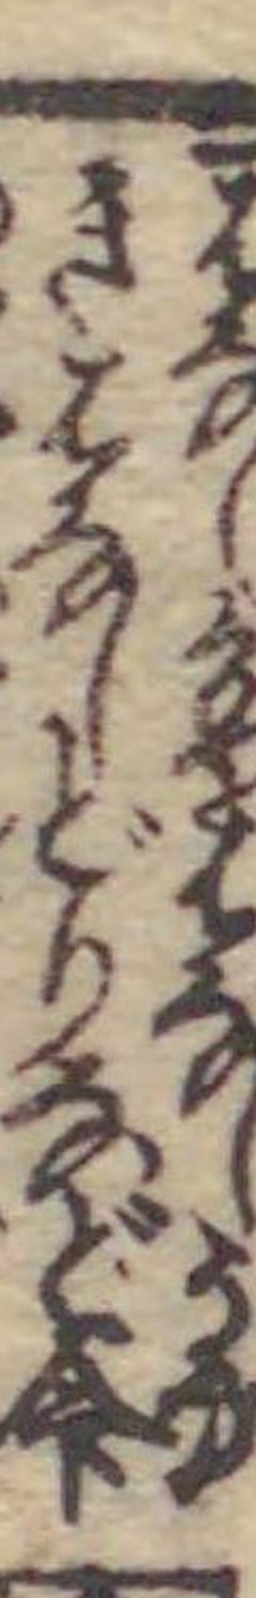きはなしどりなど命
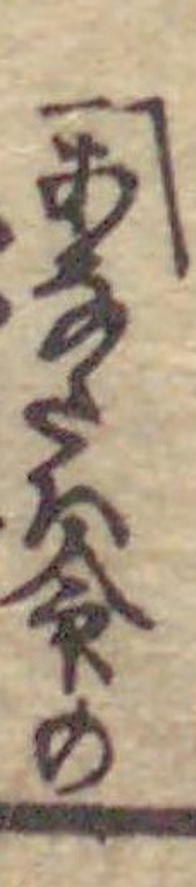〽あなたは命の
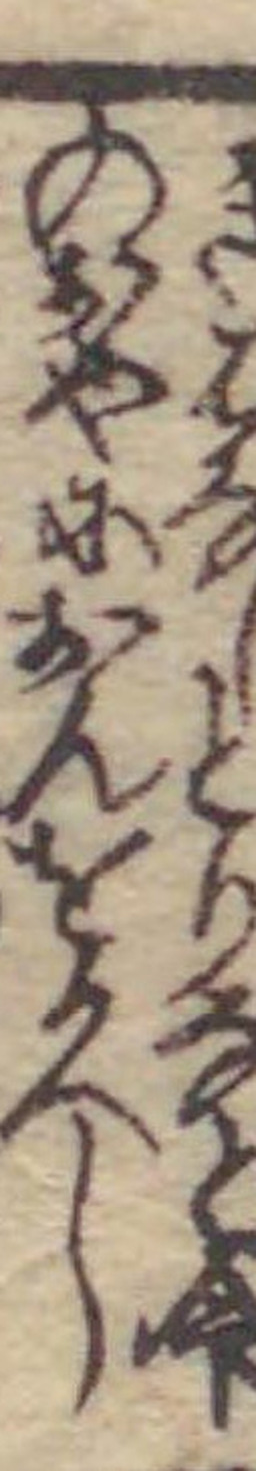のおやにおんをかへし
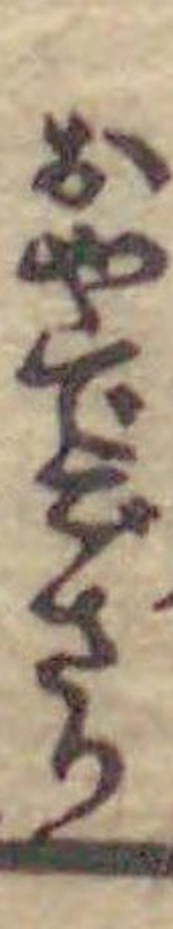おやでごさり
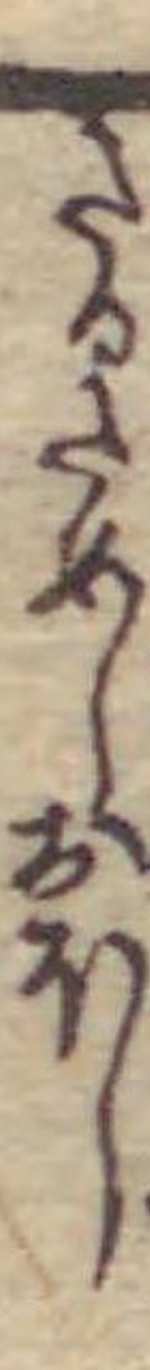たるためしおほし
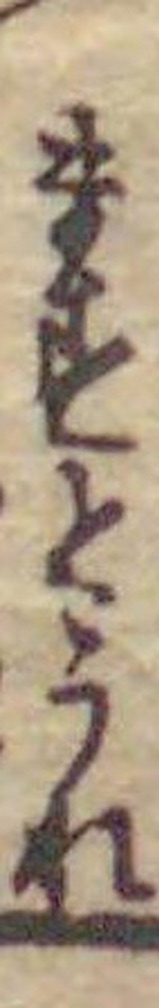ますとうれ
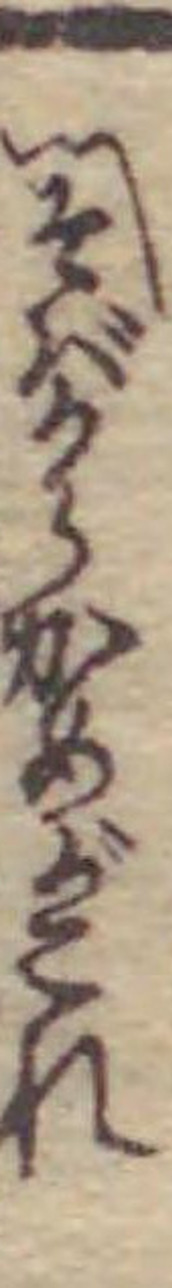〽そばからかめがこれ
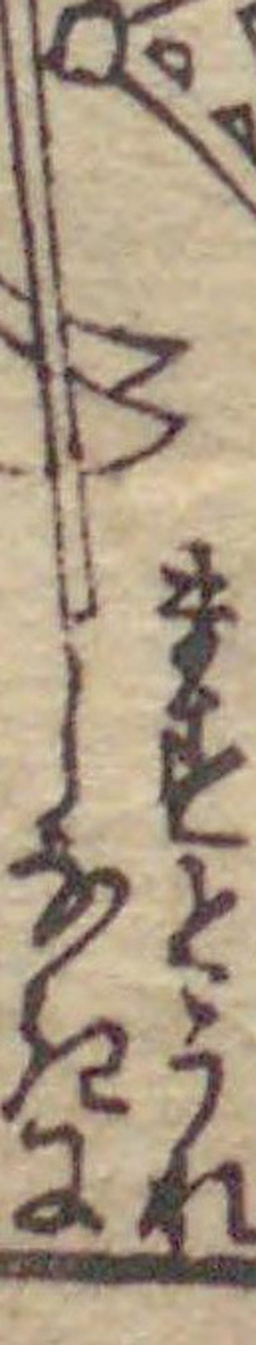しなきに
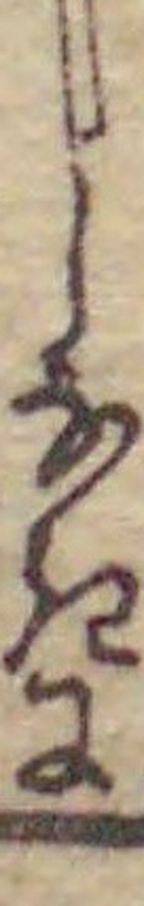しなきに
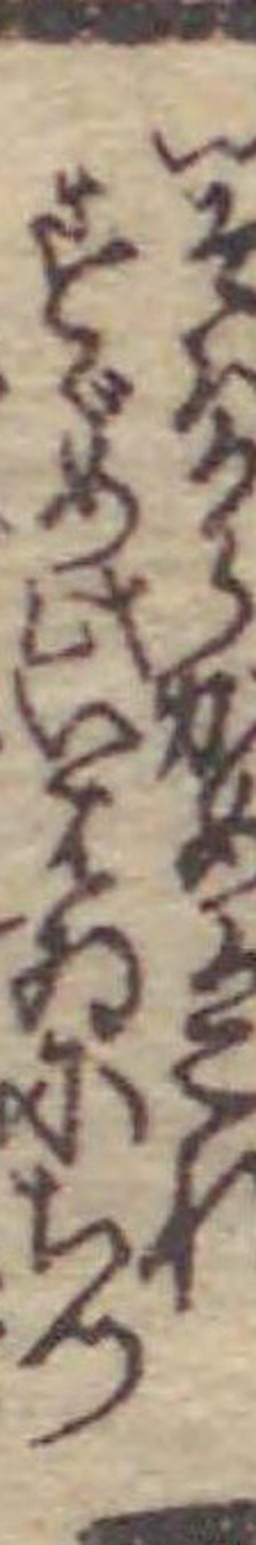すゞめ此いはゐにちつ
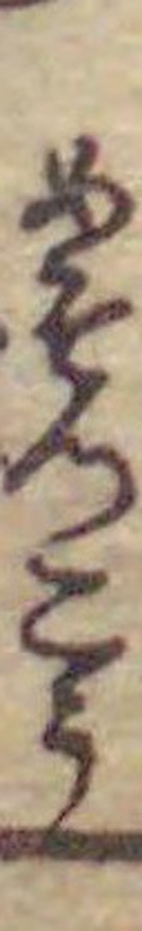めそつこう
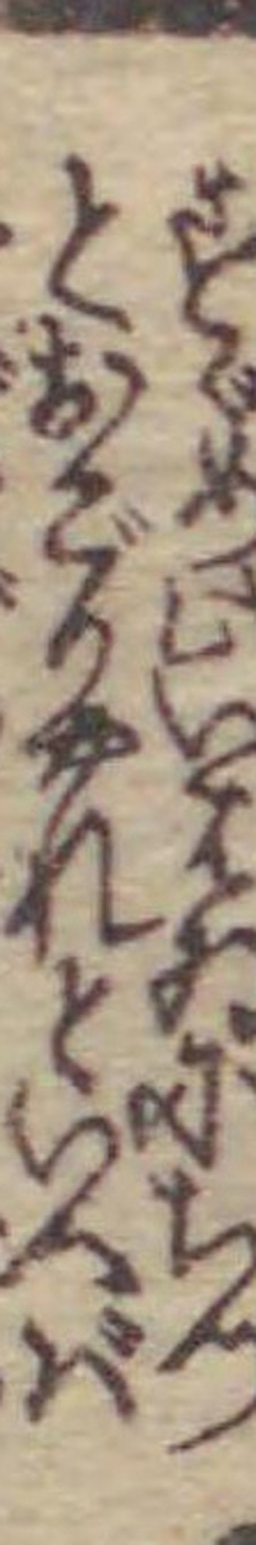とおごりやれといへば
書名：御誂染長寿小紋 : 3巻
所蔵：国立国会図書館 National Diet Library, JAPAN
